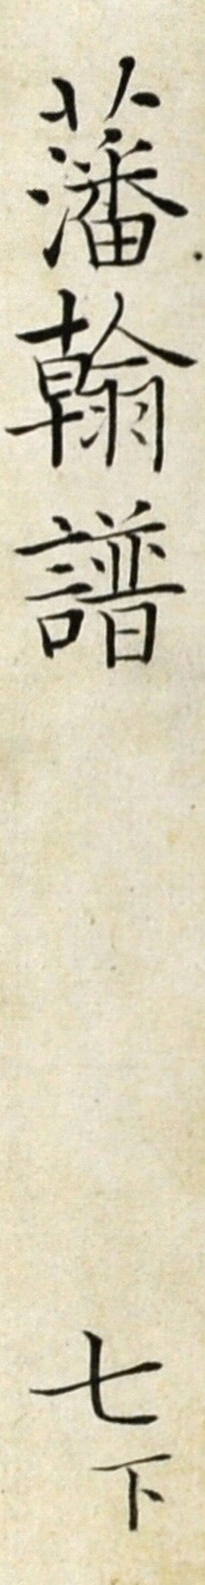藩翰譜七下

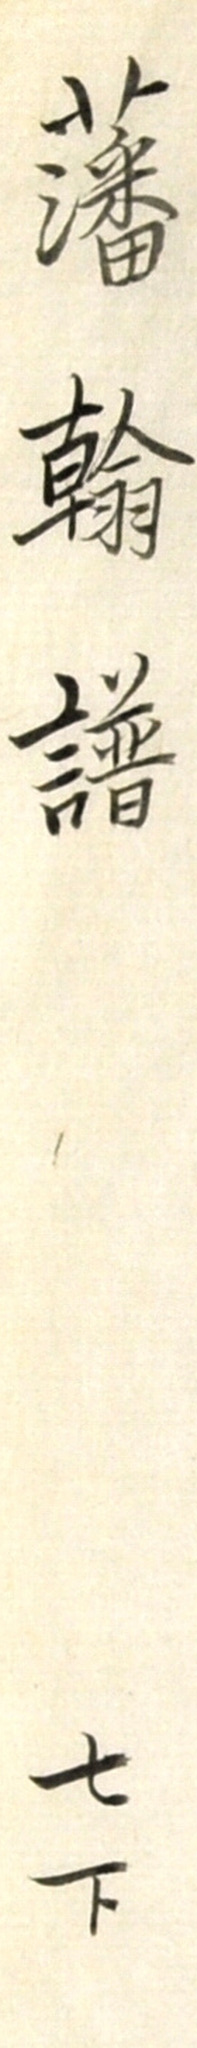藩翰譜七下

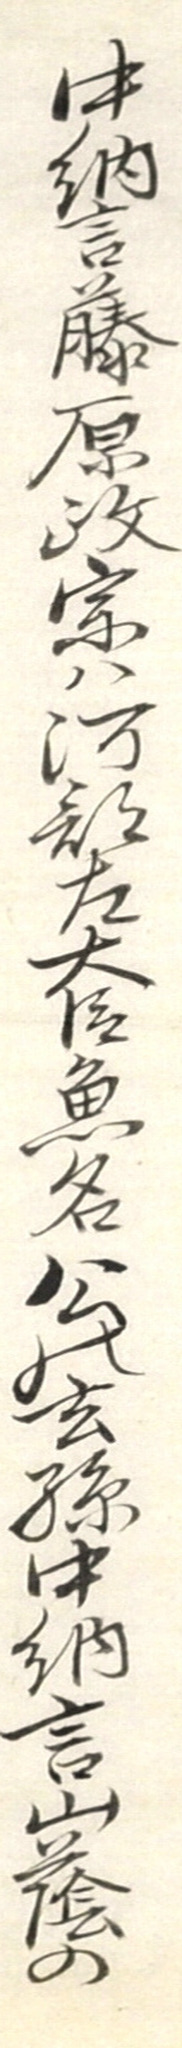中納言藤原政宗は河部左大臣魚名公の玄孫中納言山蔭の

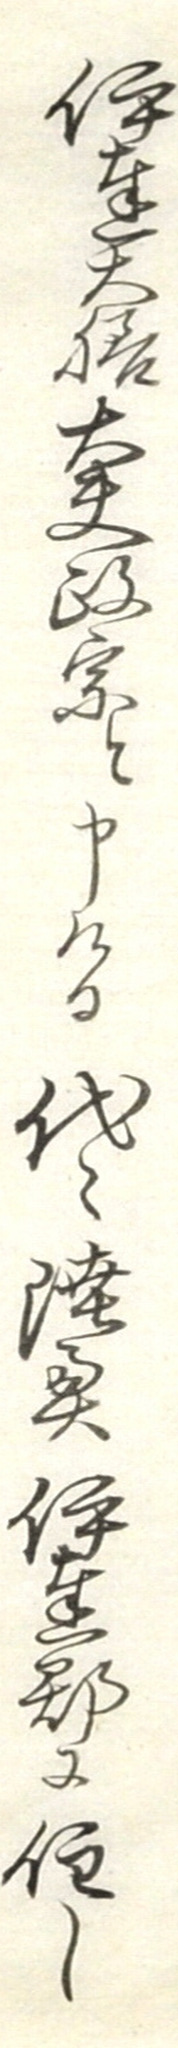伊達大膳大夫政宗と申ける代々陸奥伊達郡に住し
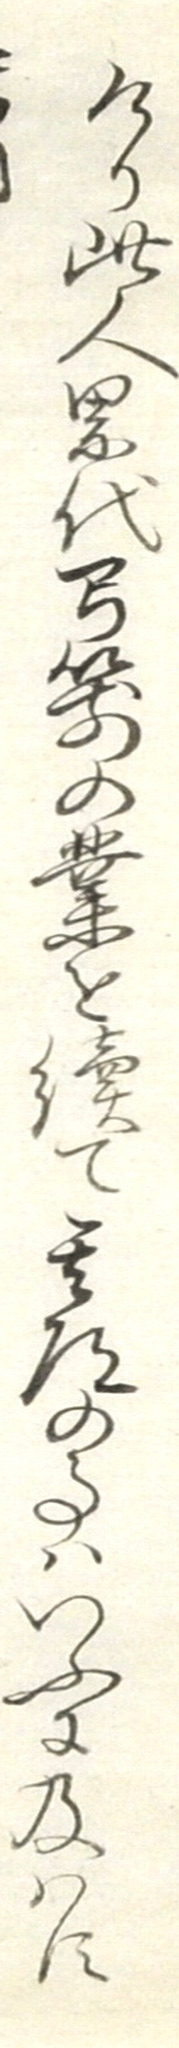けり此人累代弓箭の業を続て其道の事はいふに及はす

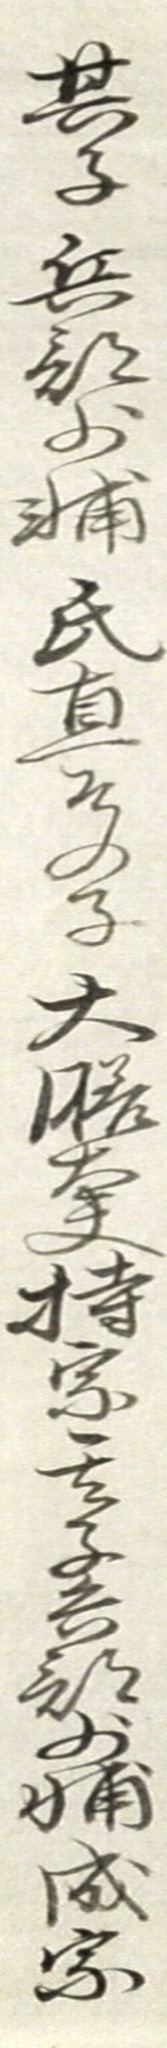其子兵部少輔氏真その子大膳大夫持宗其子兵部少輔成宗
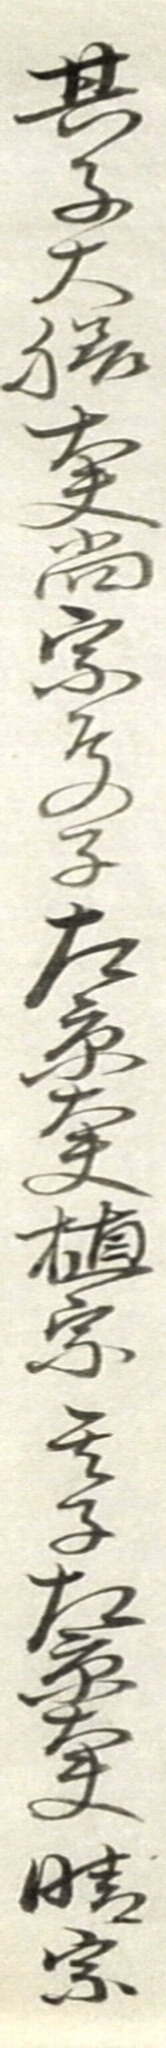其子大膳大夫尚宗その子左京大夫植宗其子左京大夫晴宗
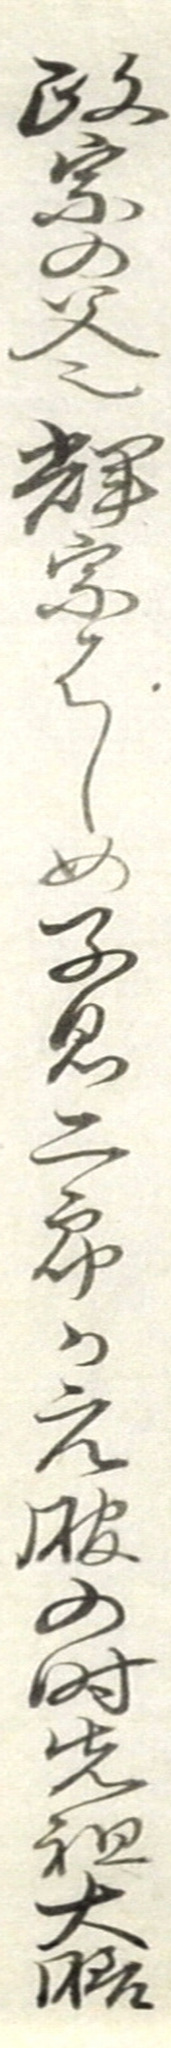政宗の父也輝宗はしめ子息二郎か元服の時先祖大膳
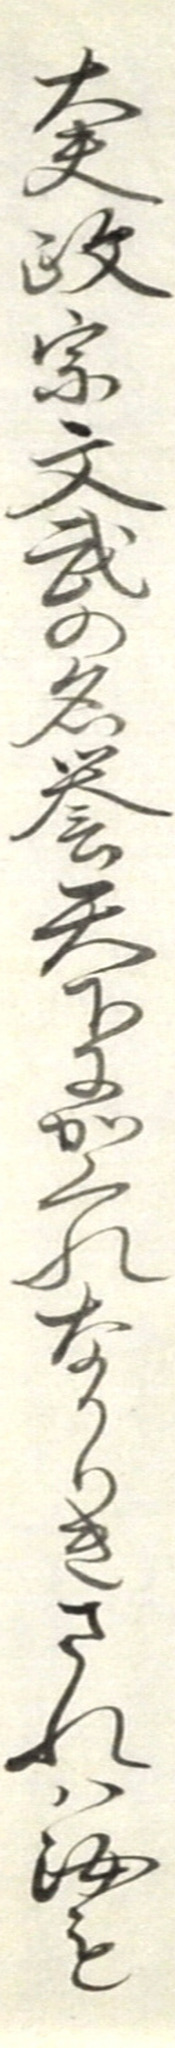大夫政宗文武の名誉天下にかくれなかりきされは汝も
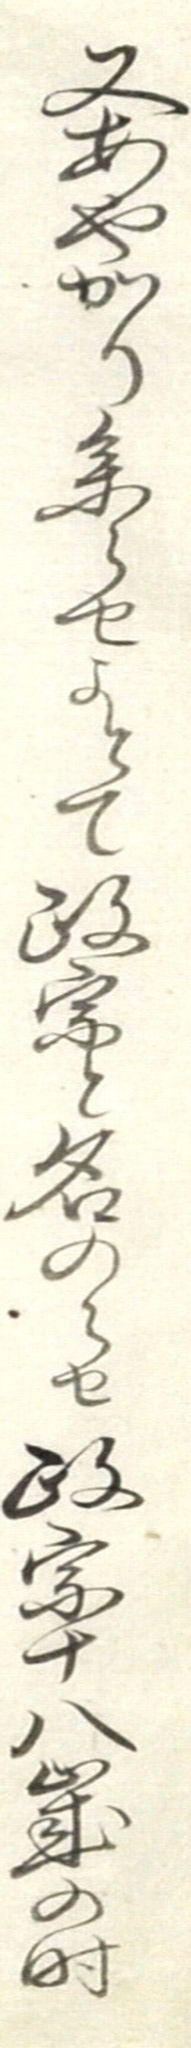又あやかり参らせよとて政宗と名のらせ政宗十八歳の時
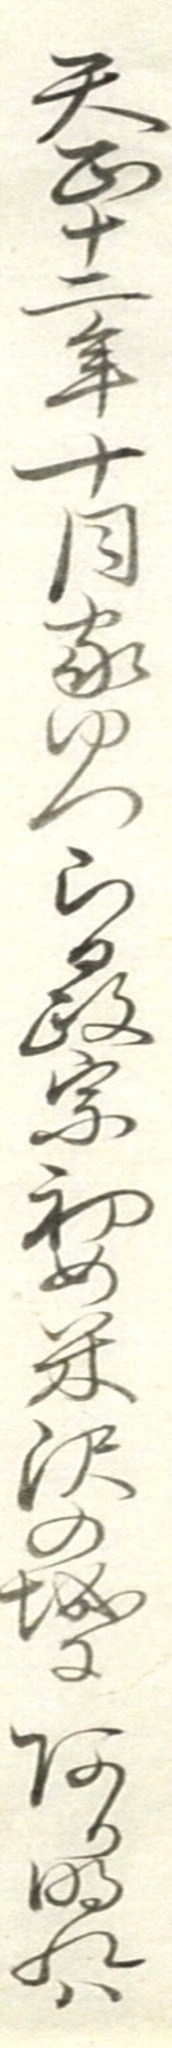天正十二年十月家ゆつらる政宗初め米沢の城にあり明れは
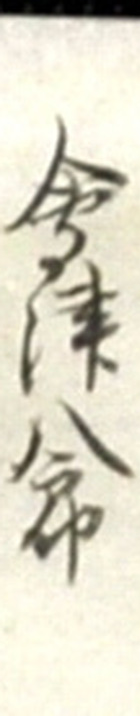会津八郎
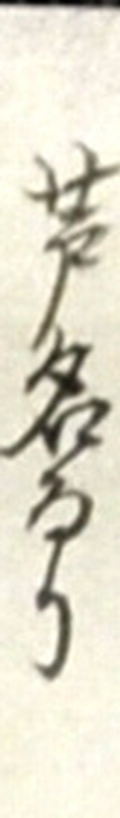蘆名なり
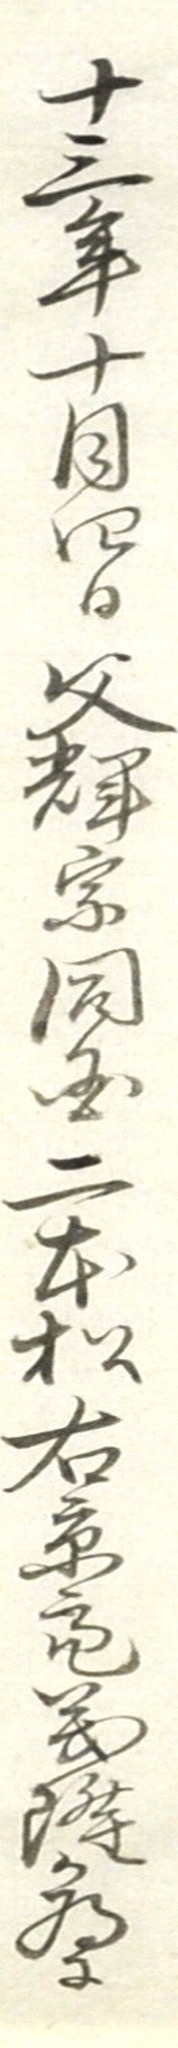十三年十月四日父輝宗同国二本松右京亮義隆か為に
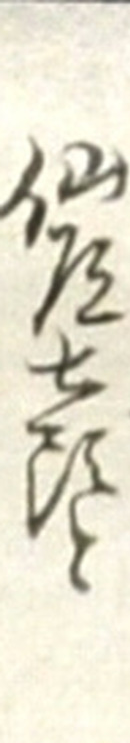仙道七郎と
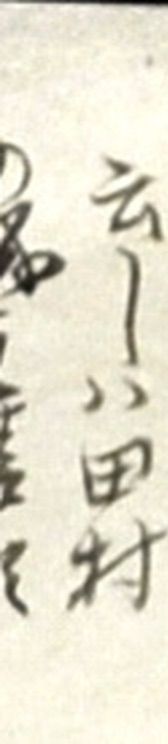云しは田村
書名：藩翰譜（七・下）
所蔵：伊那市立高遠町図書館・合同会社AMANE
